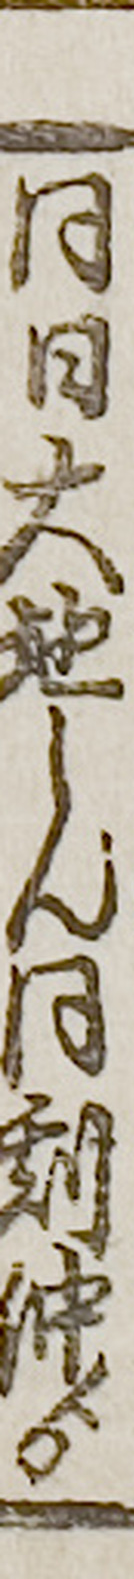同日大地しん同刻沖手
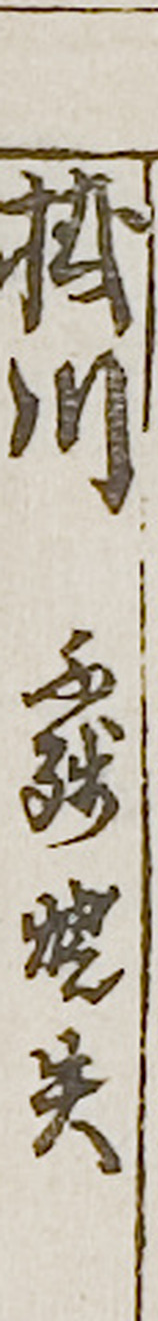掛川不残焼失
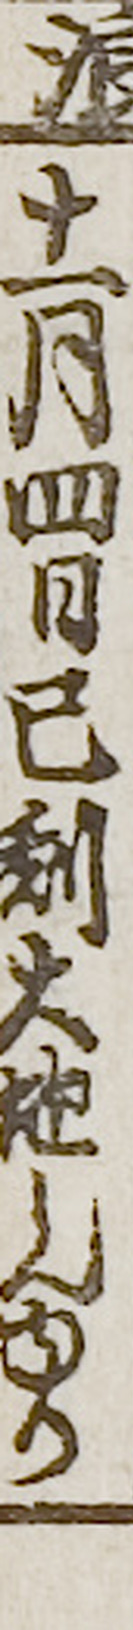十一月四日巳刻大地しんゆり
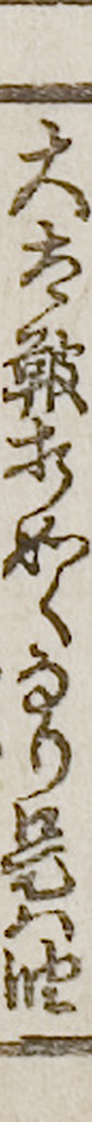大太鞁打如くなり是は油
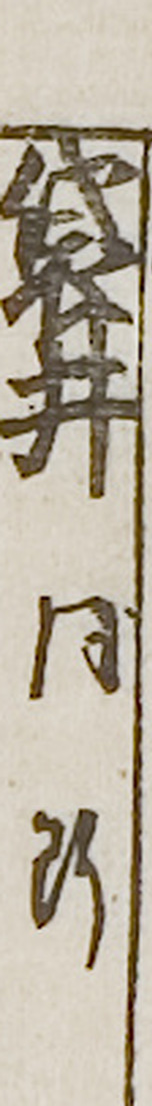袋井同断
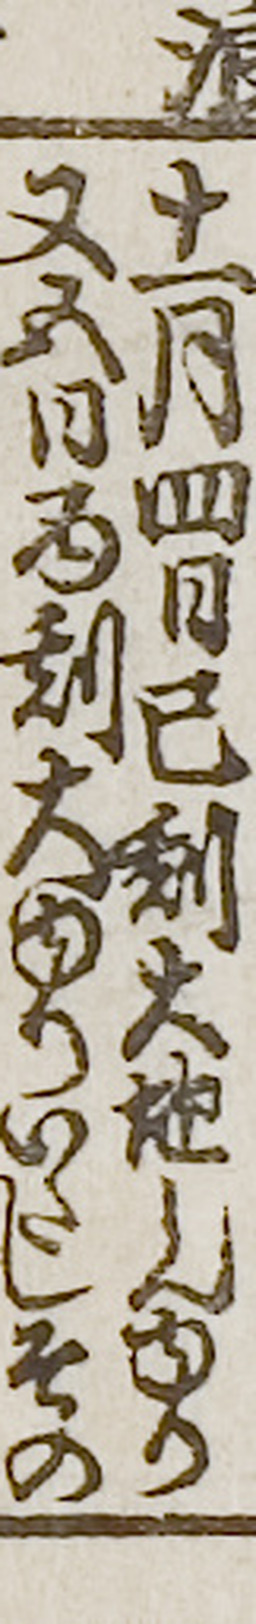又五日酉刻大ゆりいたしその
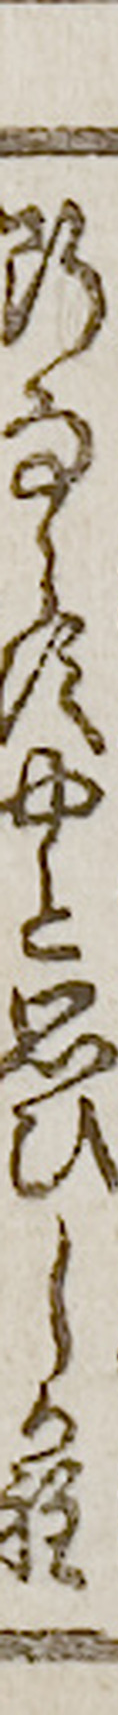断ならずやと思ひしが程
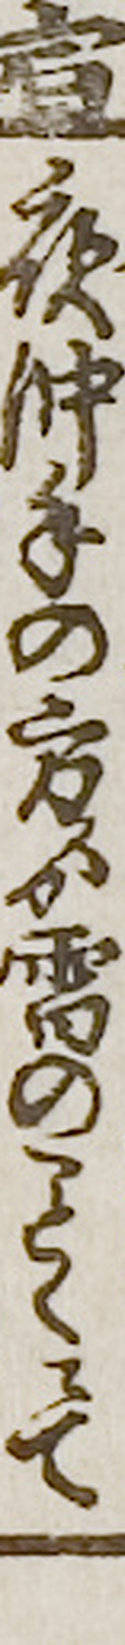夜沖手の方より雷のことくにて
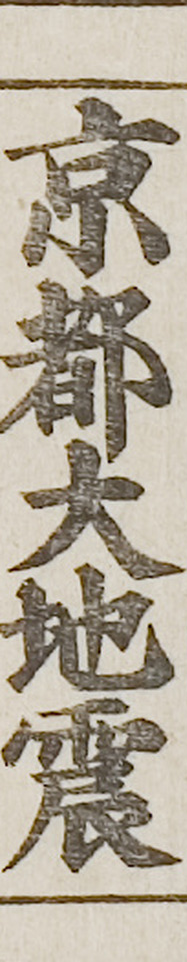京都大地震
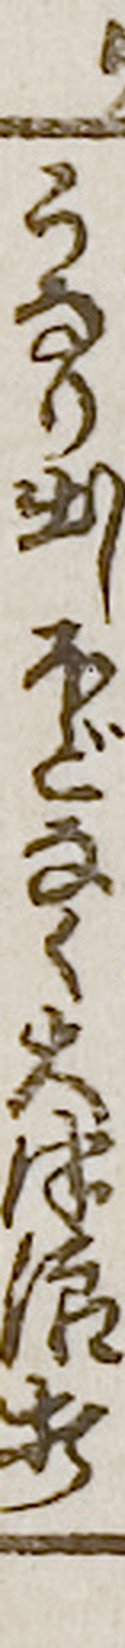うなり出しほどなく大津浪打
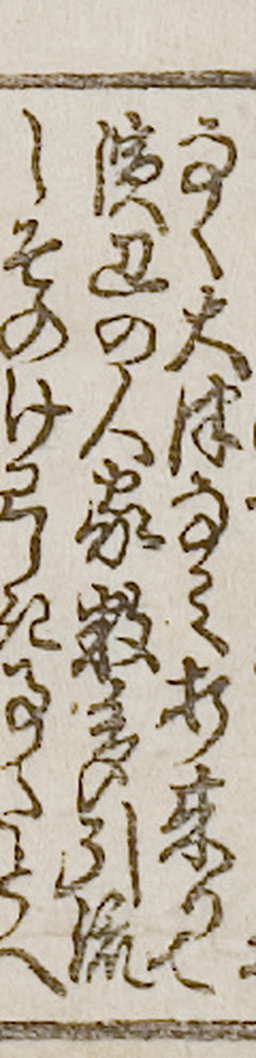浜辺の人家数多引流
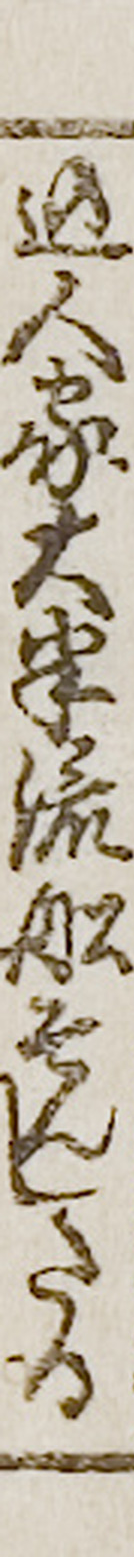込人家大半流船そんじたる
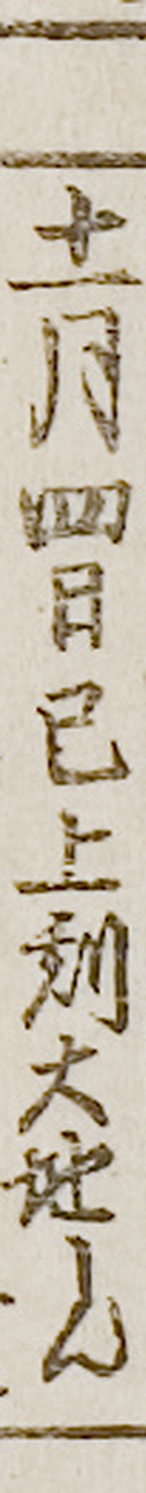十一月四日巳上刻大地しん
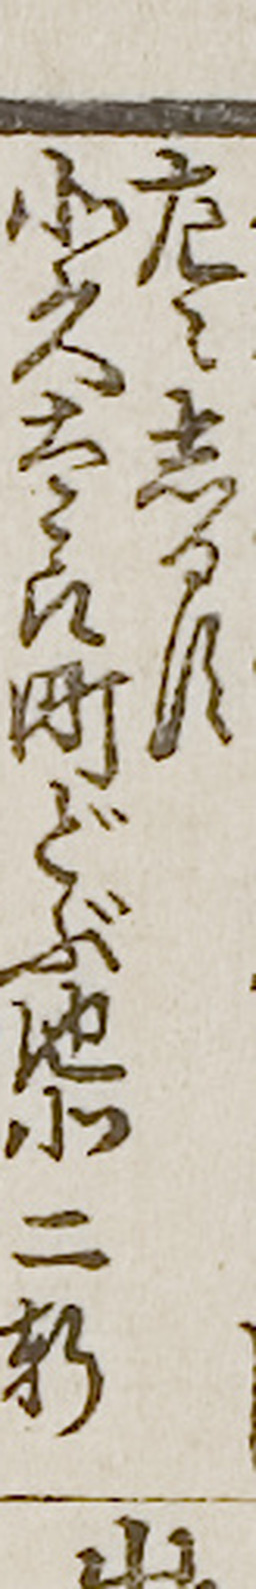北久太郎町どぶ池北二軒
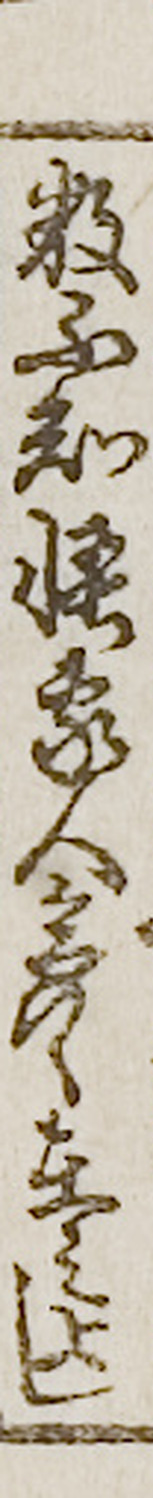数不知怪我人多く在之よし
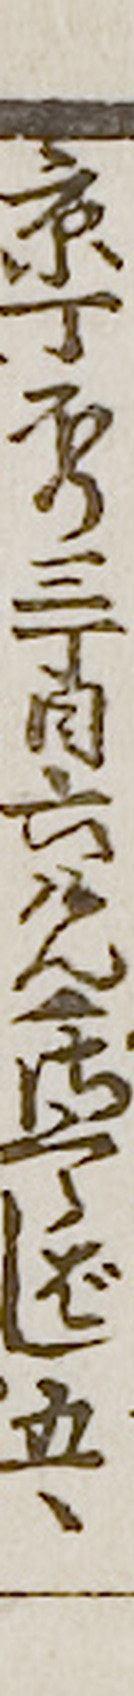京丁ほり三丁目六けん▲御くらばし五ヽ
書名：大阪大地震一覧
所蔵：東京大学総合図書館 General Library in the University of Tokyo, JAPAN
